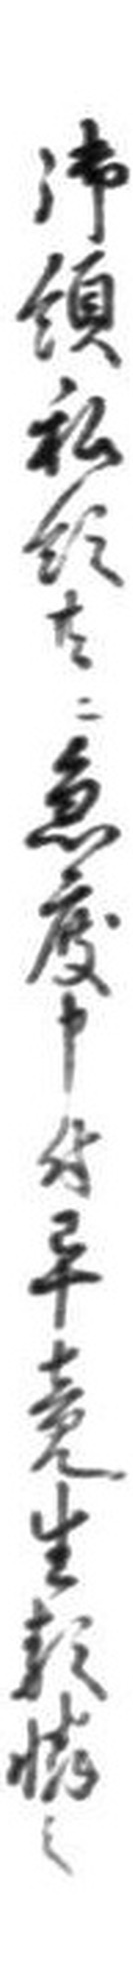御領私領共ニ急度申付畢竟生類憐之
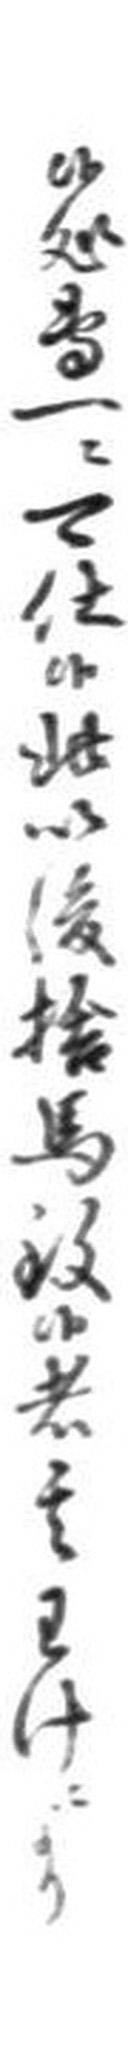候処専一ニ可仕候此以後捨馬致候者其わけにより
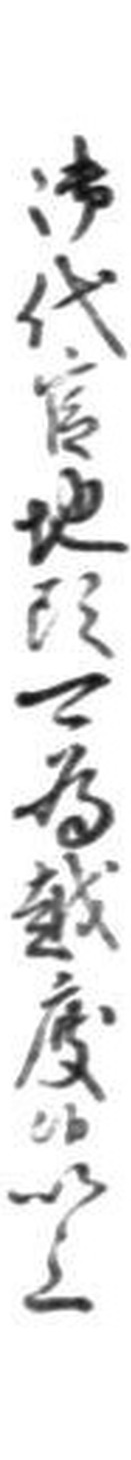御代官地頭可為越度候以上
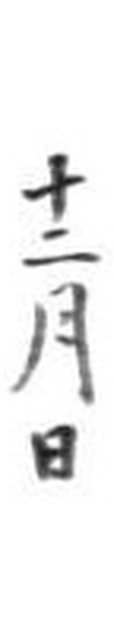十二月日
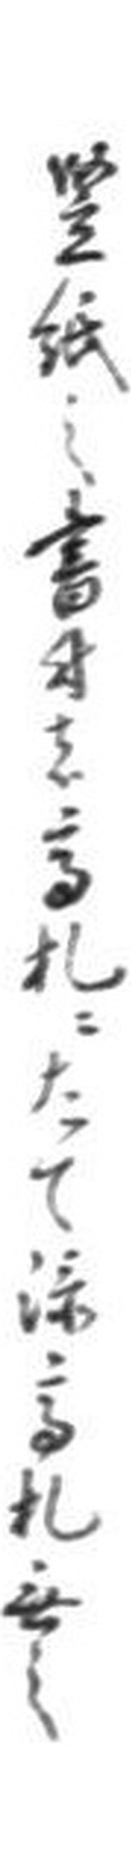竪紙之書付者高札ニたて添高札無之
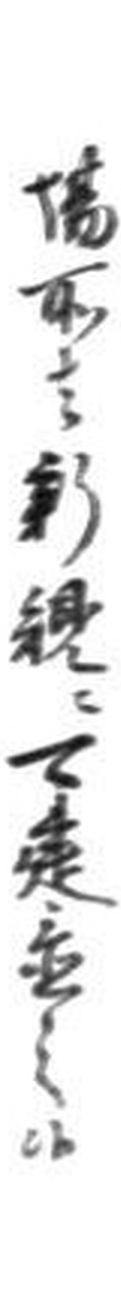場所者新規ニ建置之候

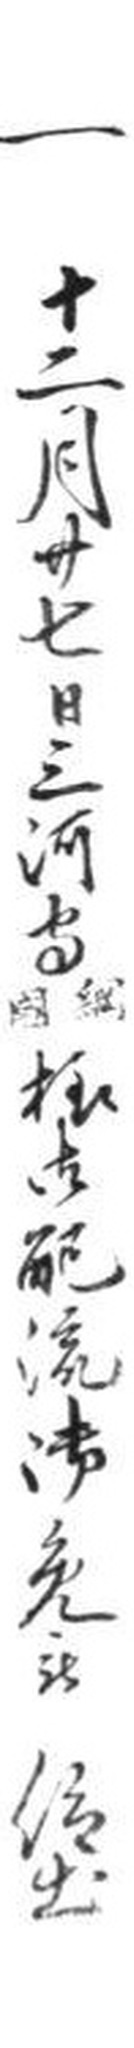一十二月廿七日三河守綱国様御配流御免被仰出
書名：家譜 十六 吉品公 従貞享三年閏三月到同四年
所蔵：福井県文書館 Fukui Prefectural Archives
